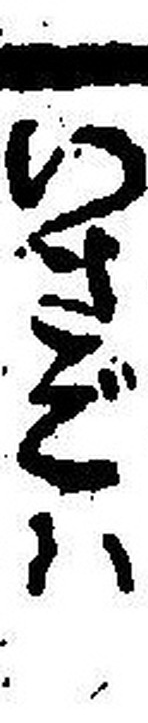いさごは
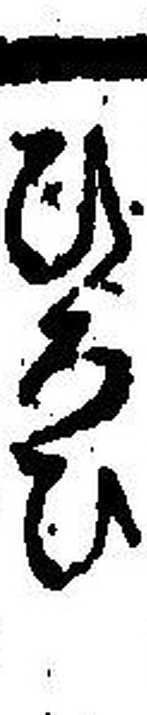ひろひ
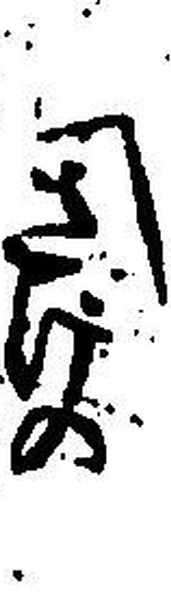〽さけの
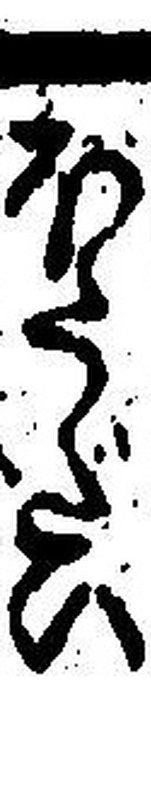ほうだい
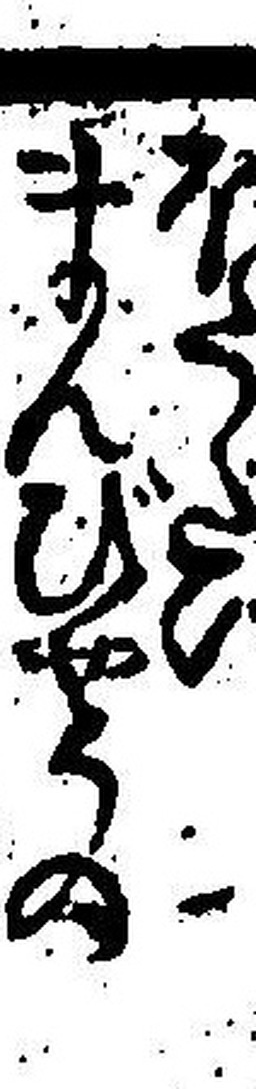まんびやうの
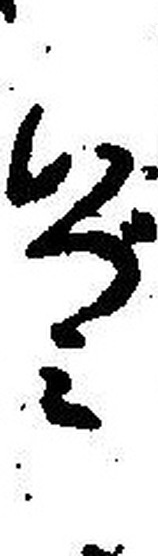いづみ
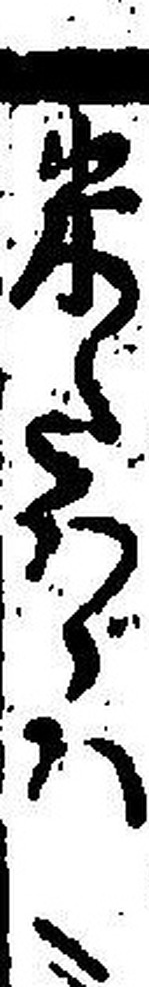米たはらは
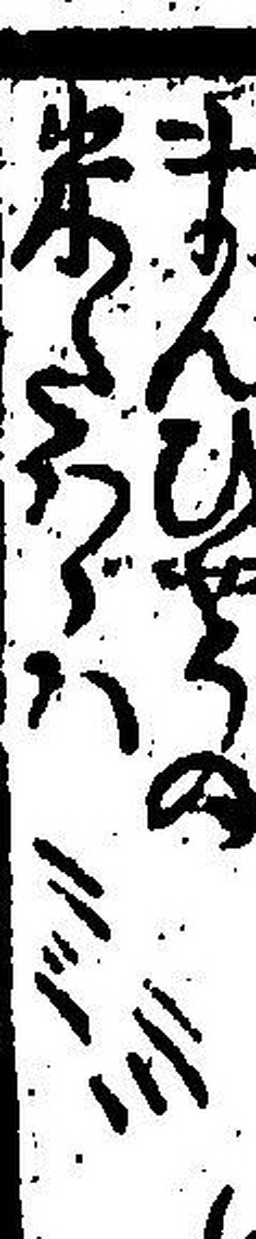米たはらは
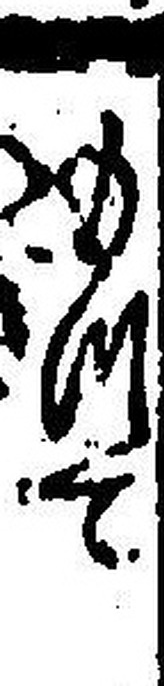もつて
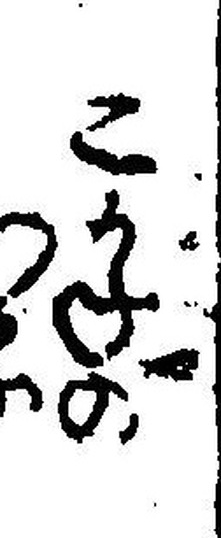こかねの
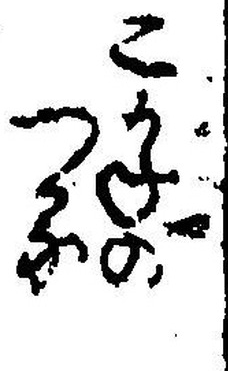こかねの
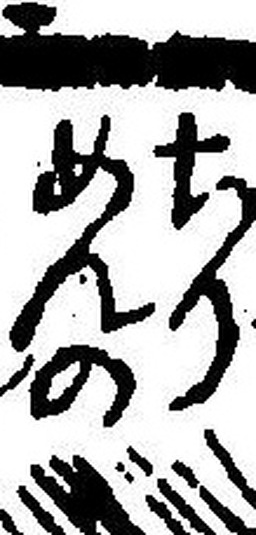めんの
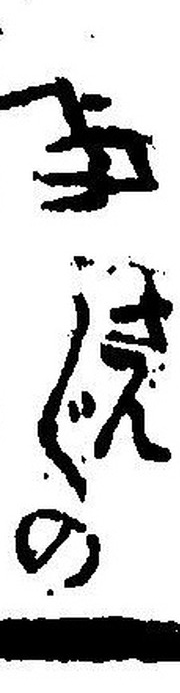めんの
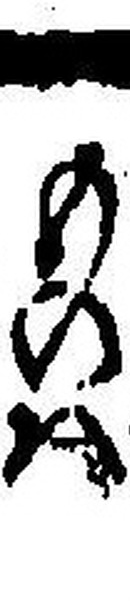ものは
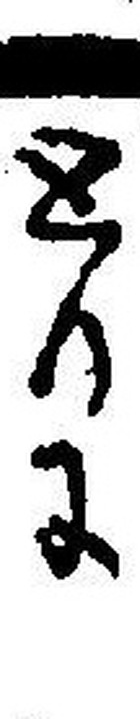とりに
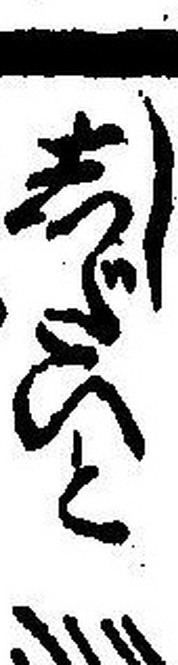しだいと
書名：徳若水縁起金性 / 樹下石上作
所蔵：東京大学総合図書館 General Library in the University of Tokyo, JAPAN
